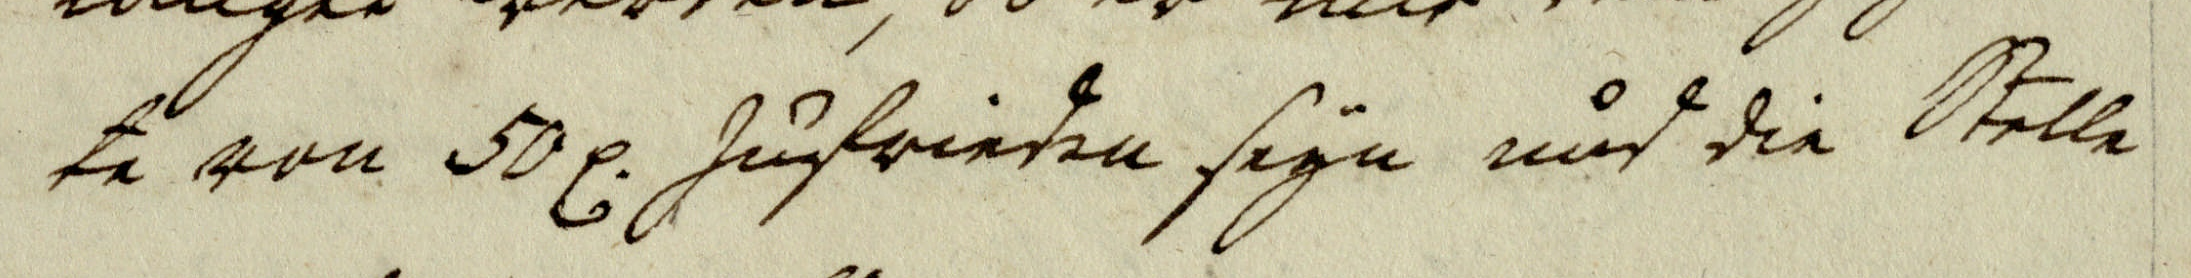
te von 50 l. zufrieden seÿn und die Stelle
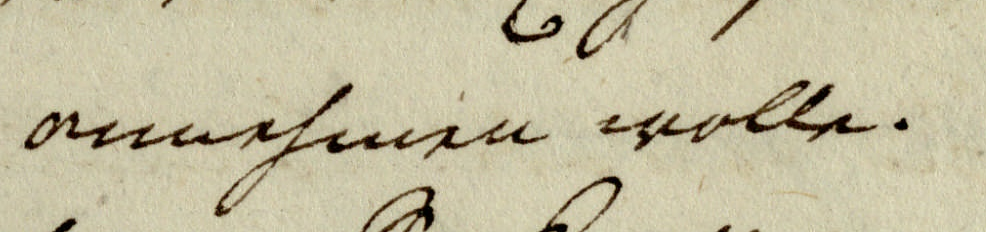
annehmen wolle.
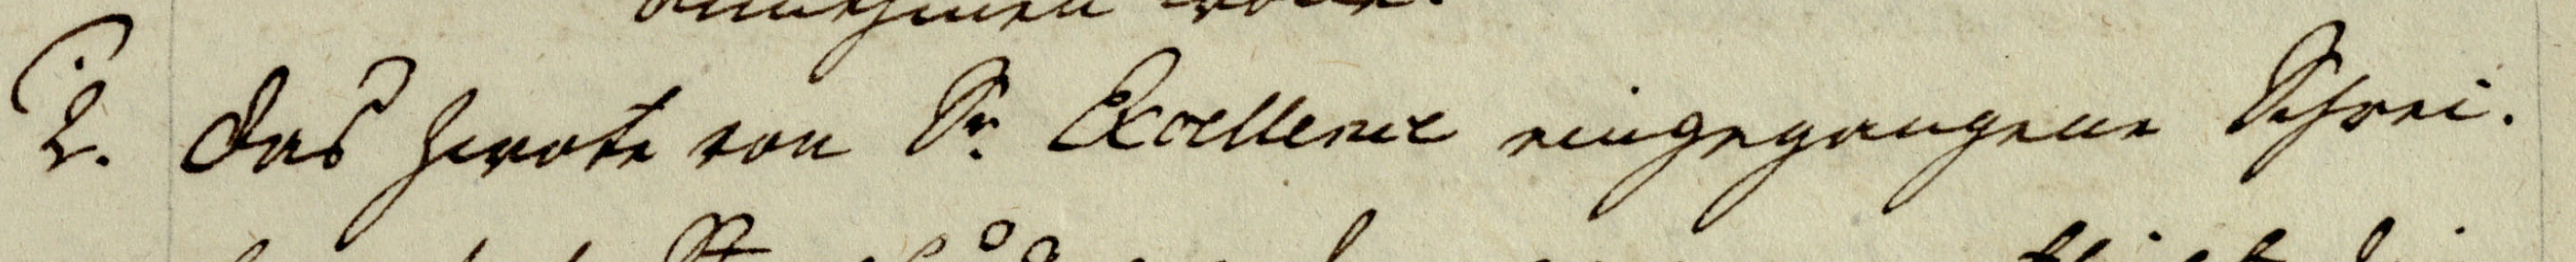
2. Das zwote von Sr. Excellence eingegangene Schrei¬
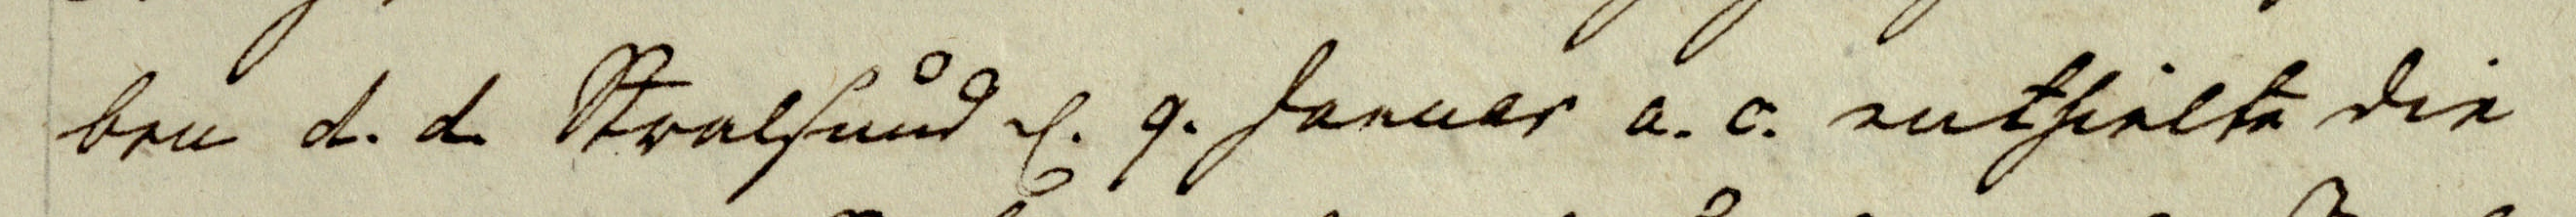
ben d. d. Stralsund d. 9. Januar a. c. enthielte die
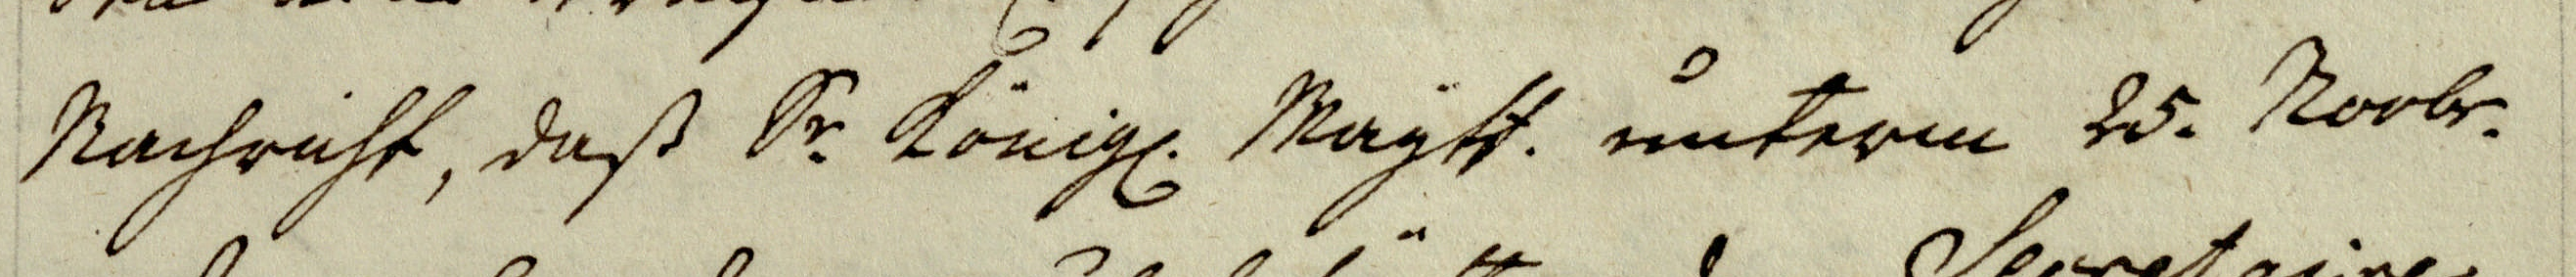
Nachricht, daß Sr Königl. Maÿtt. unterm 25. Novbr.
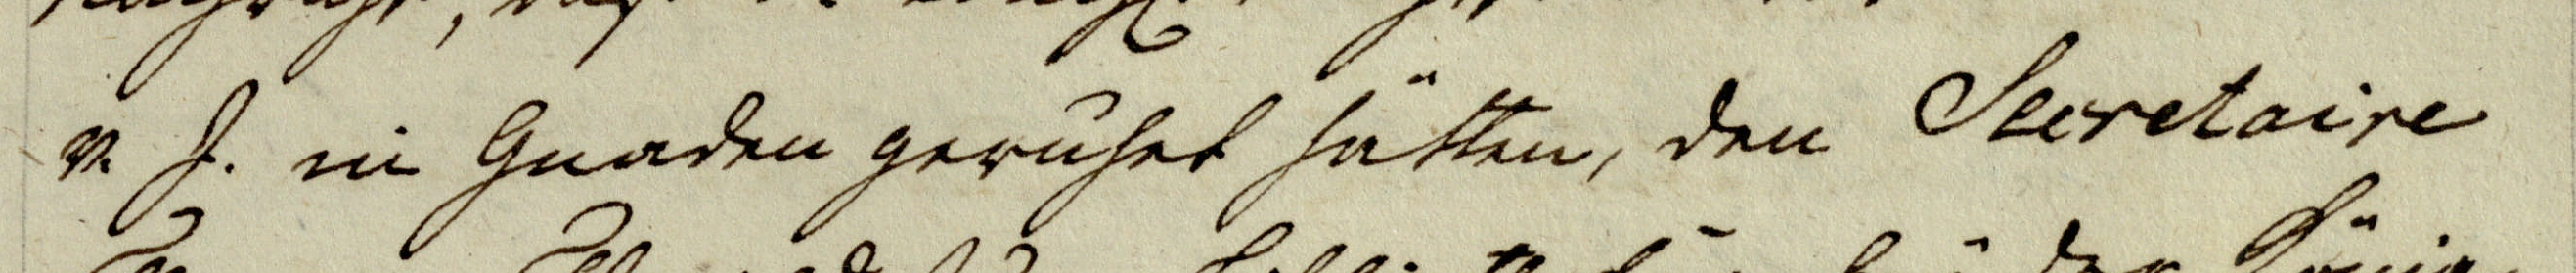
v. J. in Gnaden geruhet hätten, den Secretaire
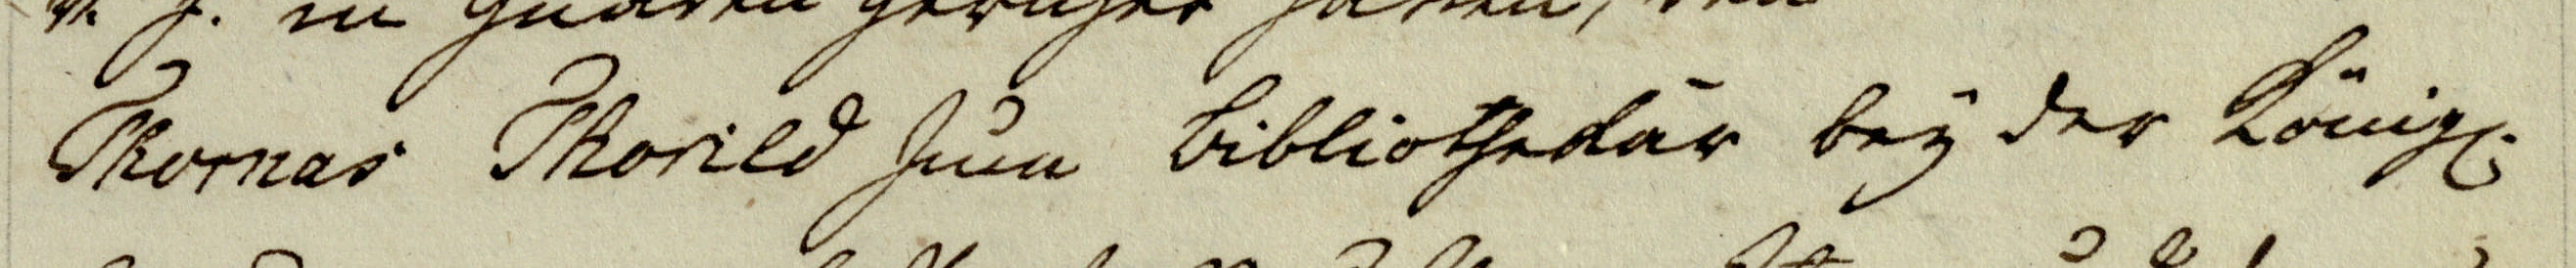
Thomas Thorild zum Bibliothekar beÿ der Königl.
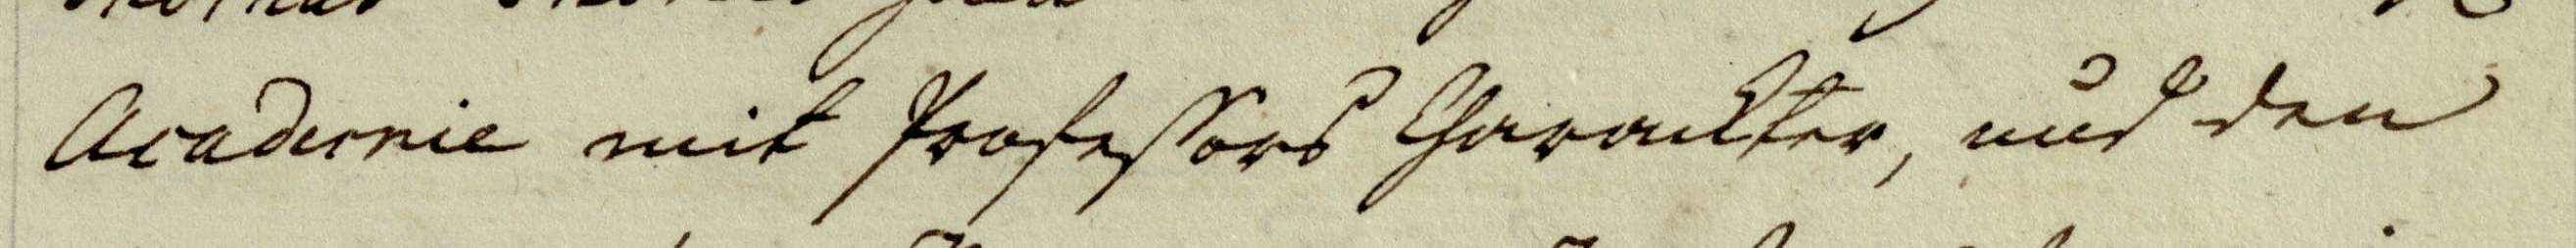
Academie mit Professors Charackter, und den
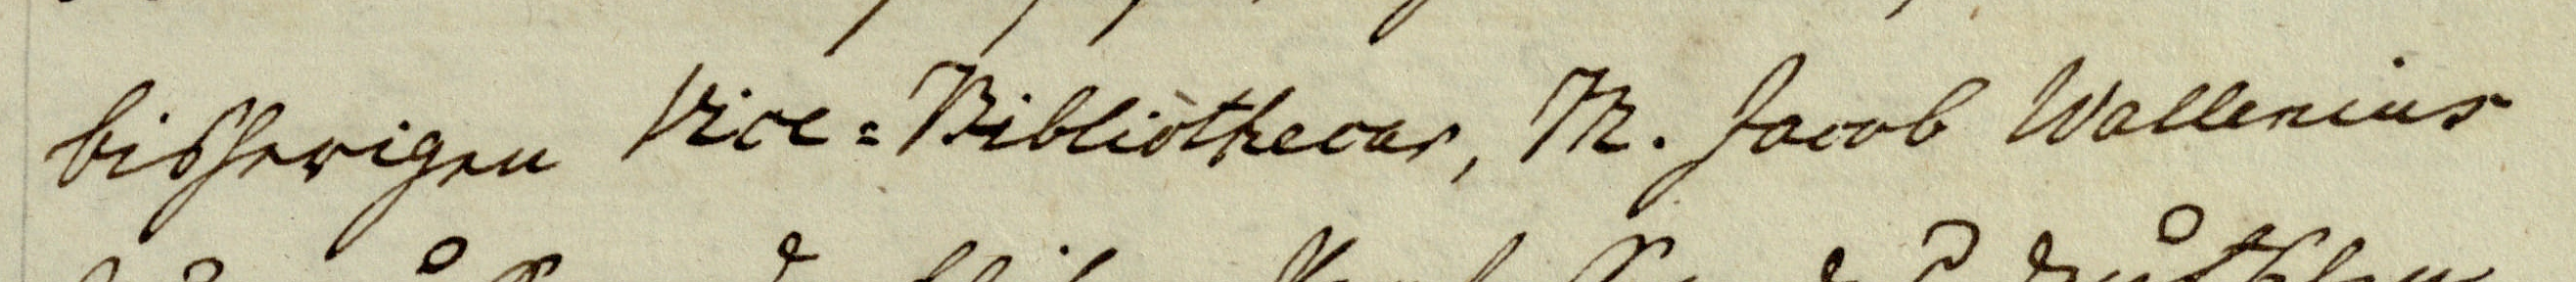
bisherigen Vice Bibliothecar, M. Jacob Wallenius
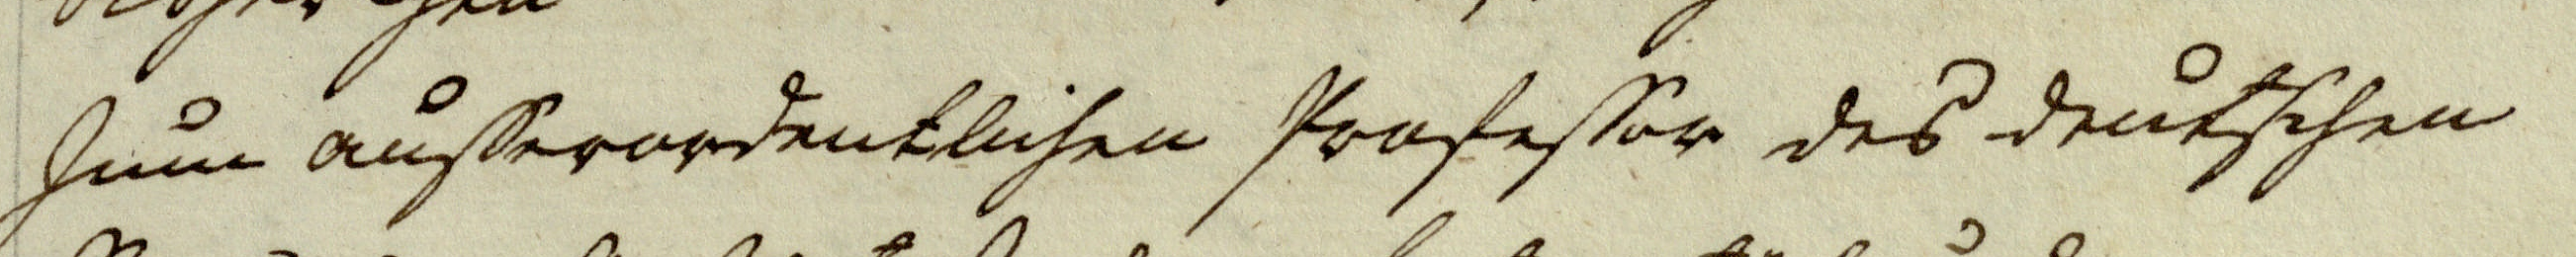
zum ausserordentlichen Professor des deutschen
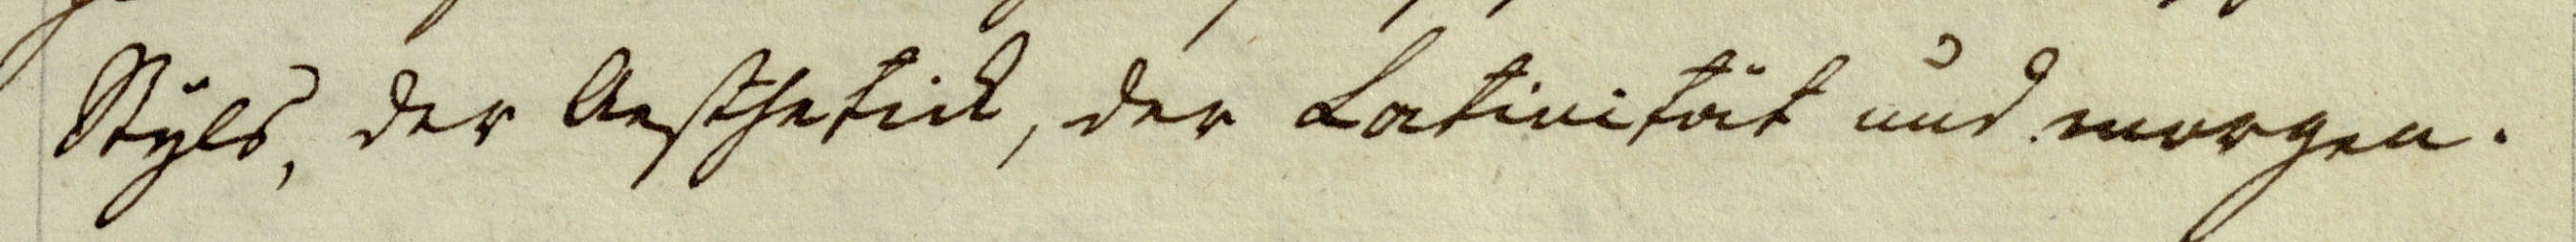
Stÿls, der Aesthetick, der Latinität und morgen¬
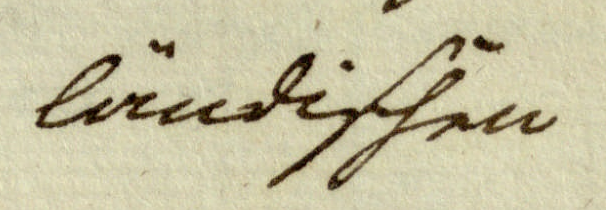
ländischen
